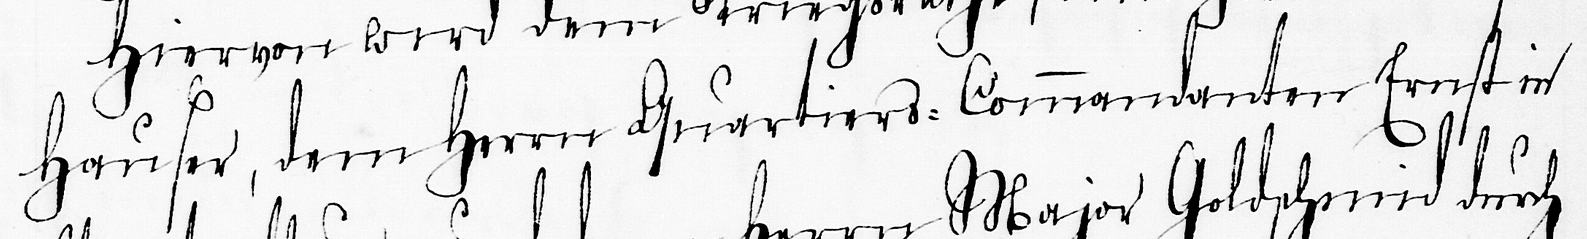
Hauser, dem Herrn Quartiers-Commandanten Ernst in
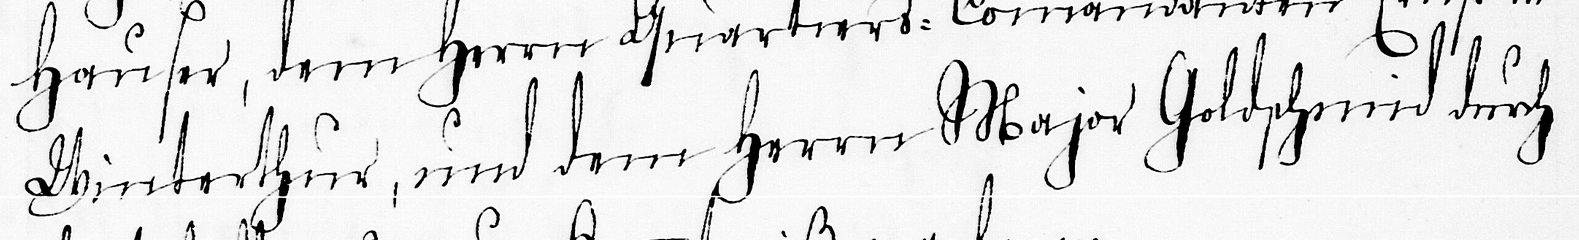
Winterthur, und dem Herrn Major Goldschmid durch
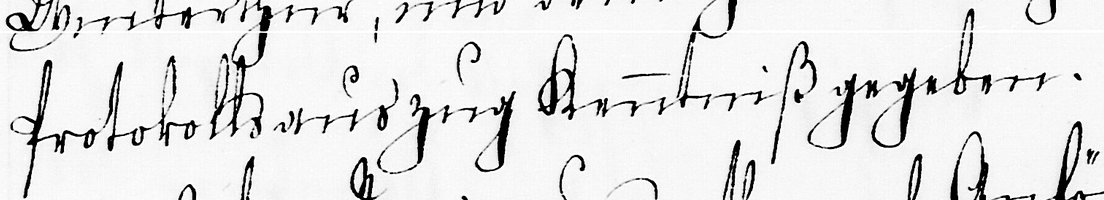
Protokollsauszug Kenntniß gegeben.
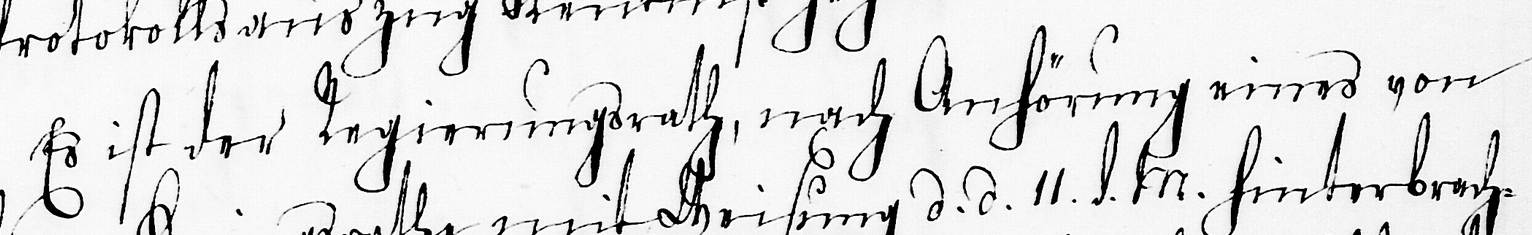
Es ist der Regierungsrath, nach Anhörung eines von
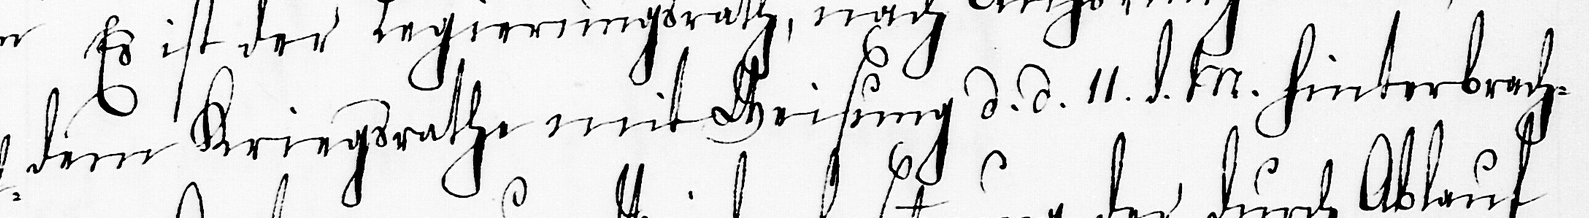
dem Kriegsrathe mit Weisung d. d. 11. d. M. hinterbrach¬
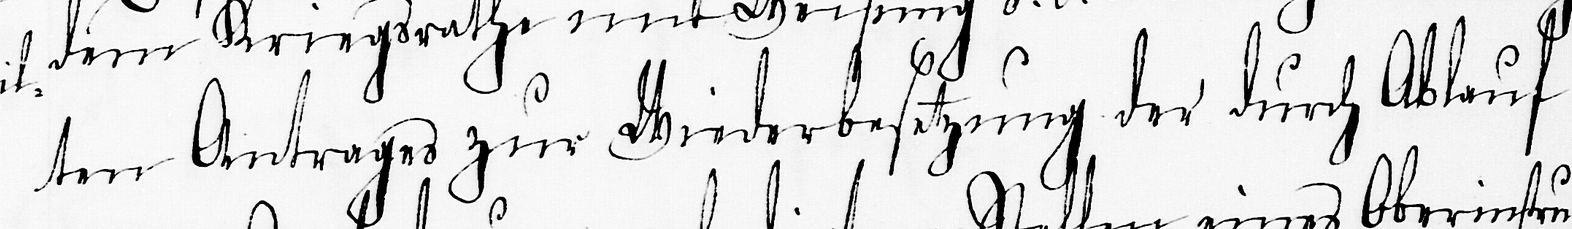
ten Antrages zur Wiederbesetzung der durch Ablauf
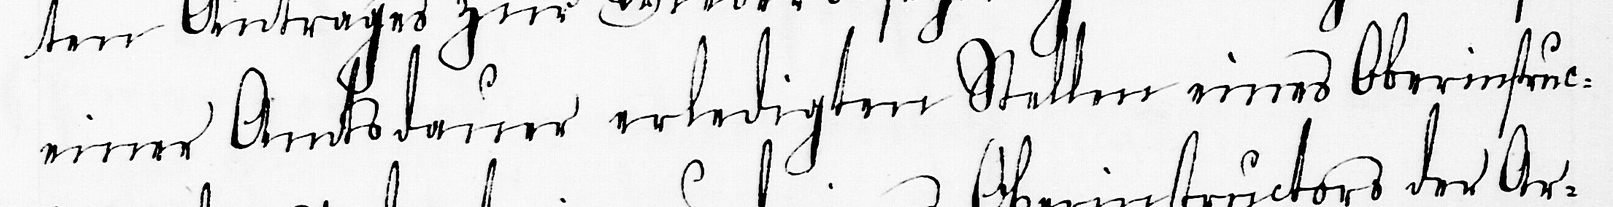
einer Amtsdauer erledigten Stellen eines Oberinstruc¬
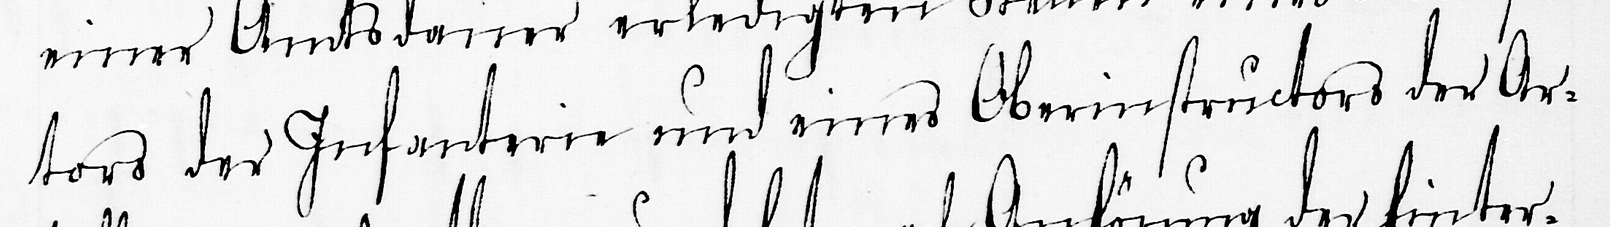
tors der Infanterie und eines Oberinstructors der Ar¬
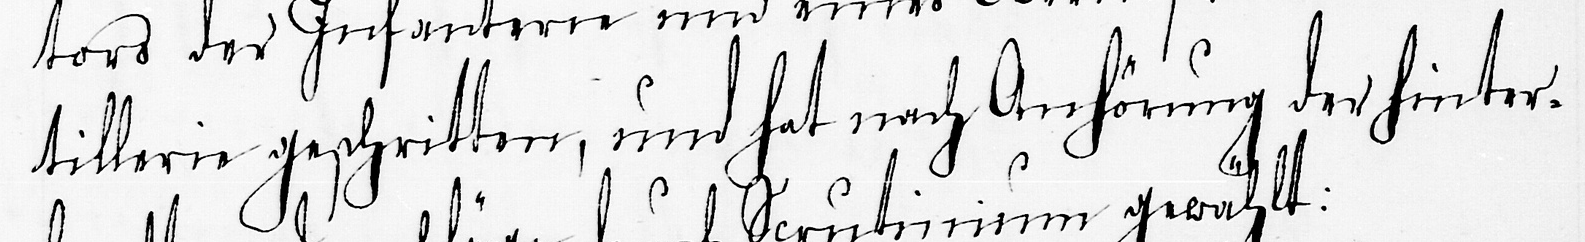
tillerie geschritten, und hat nach Anhörung der hinter¬
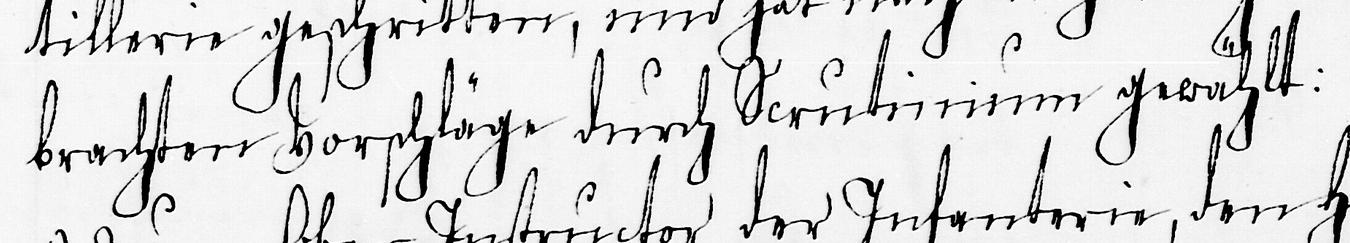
brachten Vorschläge durch Scrutirium gewählt:
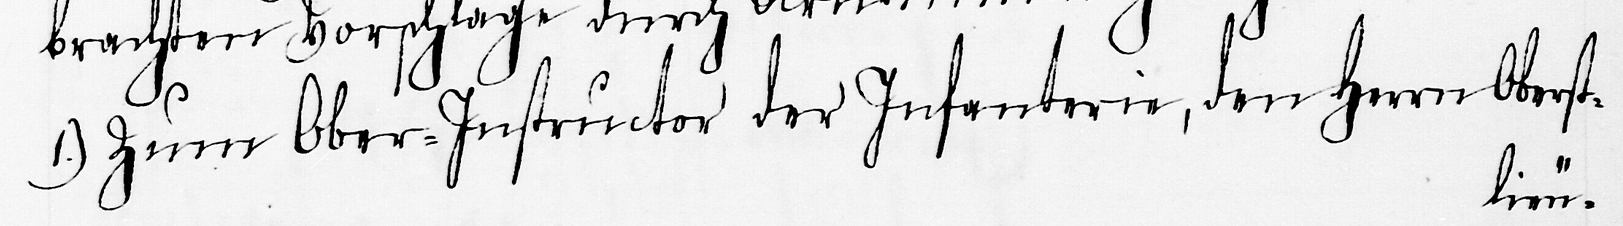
1.) Zum Ober-Instructor der Infanterie, den Herrn Oberst-
